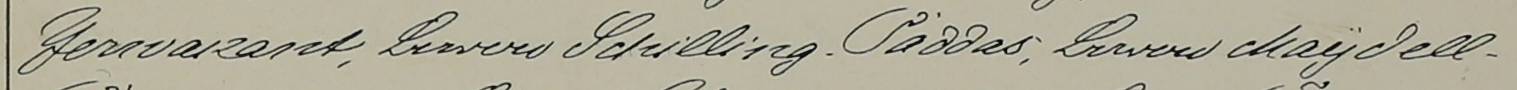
Jerwakant, Baron Schilling-Paddas, Baron Maydell-
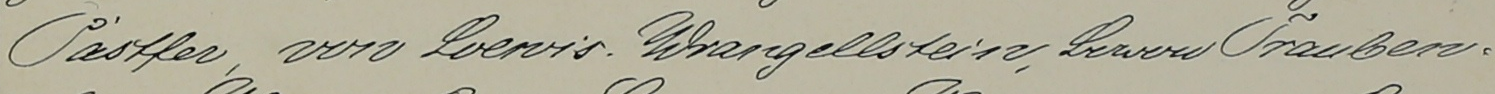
Pastfer, von Loewis-Wrangelstein, Baron Trauben-
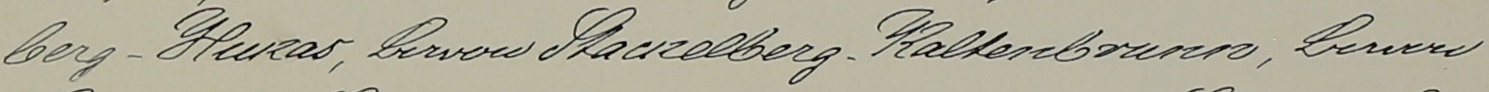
berg-Hukas, Baron Stackelberg-Kaltenbrunn, Baron
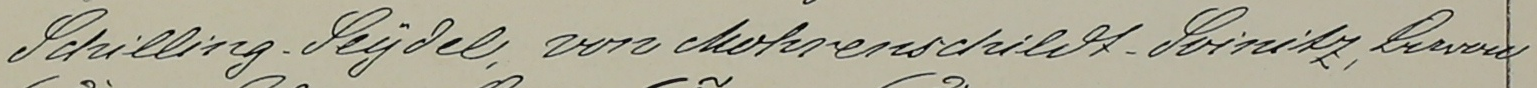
Schilling-Seydel, von Mohrenschildt-Soinitz, Baron
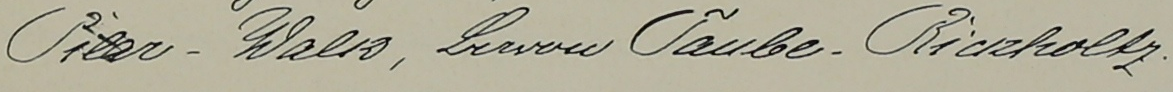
Pilar-Walk, Baron Taube-Rickholtz.
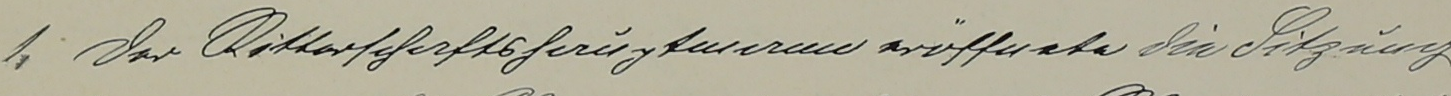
1. Der Ritterschaftshauptmann eröffnete die Sitzung
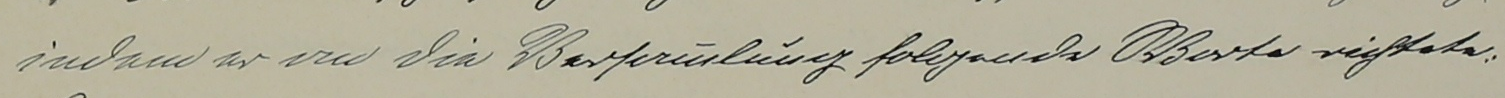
indem er an die Versammlung folgende Worte richtete:
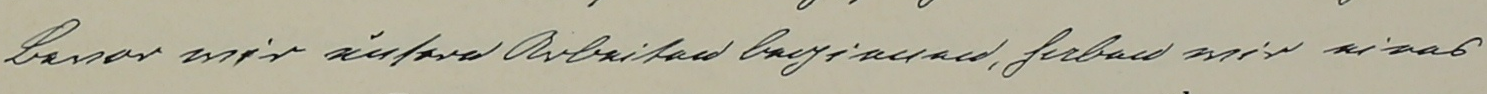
Bevor wir unsere Arbeiten beginnen, haben wir eines
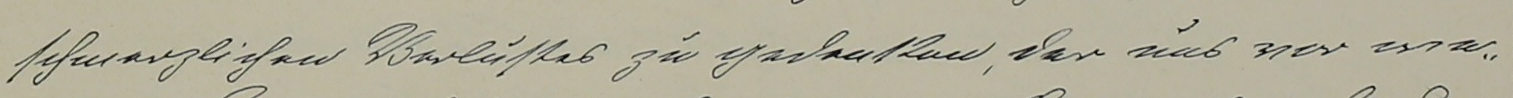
schmerzlichen Verlustes zu gedenken, der uns vor we-
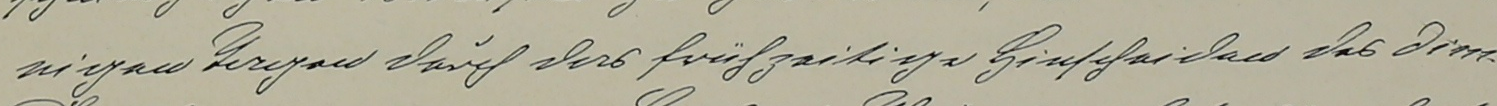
nigen Tagen durch das frühzeitige Hinscheiden des dim.
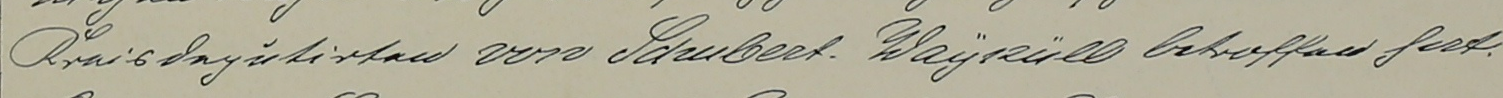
Kreisdeputirten von Schubert-Wayküll betroffen hat.
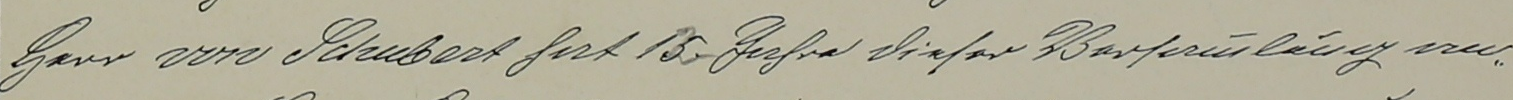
Herr von Schubert hat 12 Jahre dieser Versammlung an-
